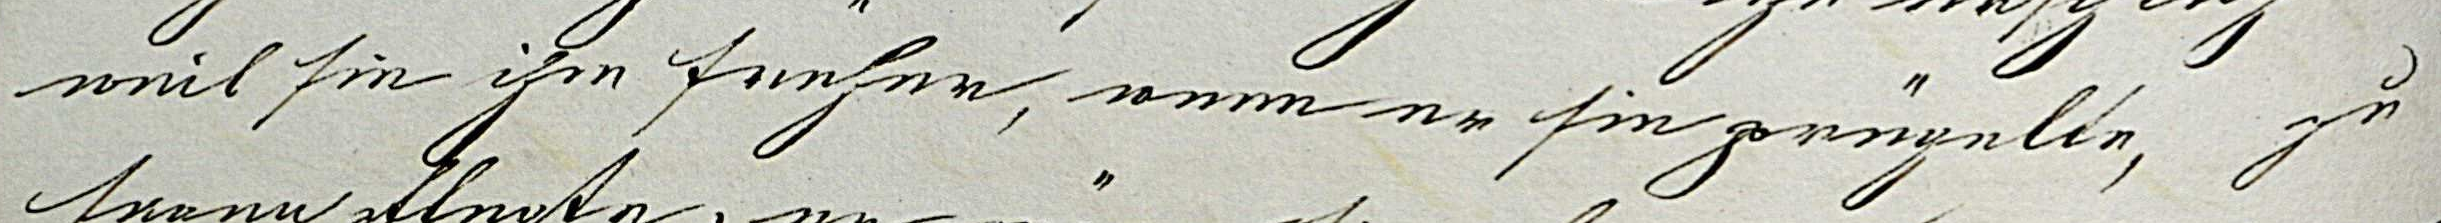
weil sie ihm früher, wenn er sie prügelte, zu
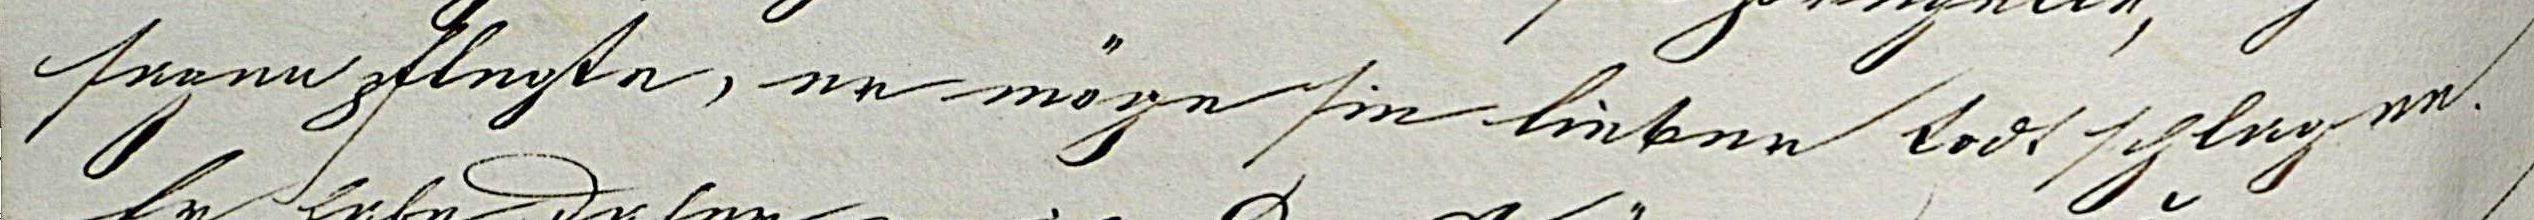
sagen pflegte, er möge sie lieber todt schlagen.
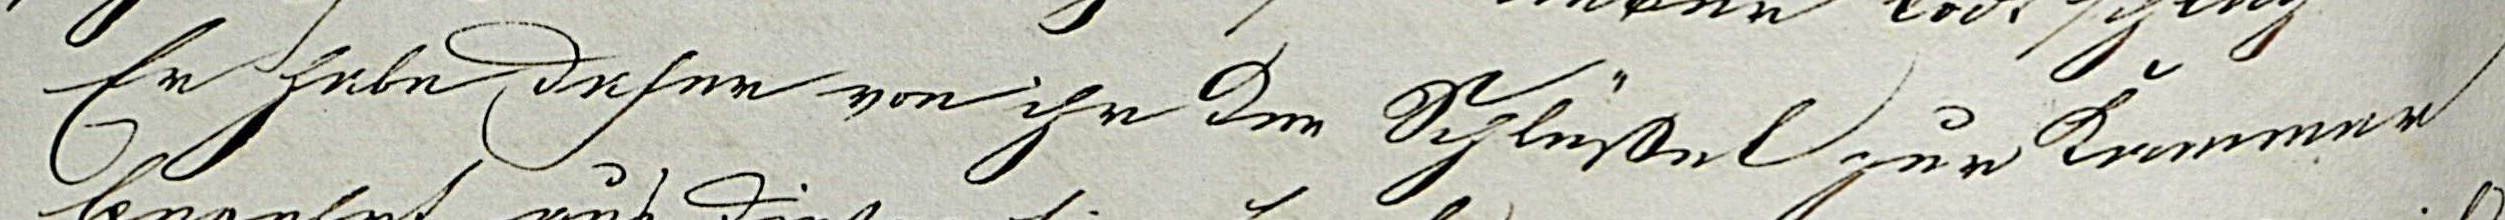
Er habe daher von ihr den Schlüßel zur Kammer
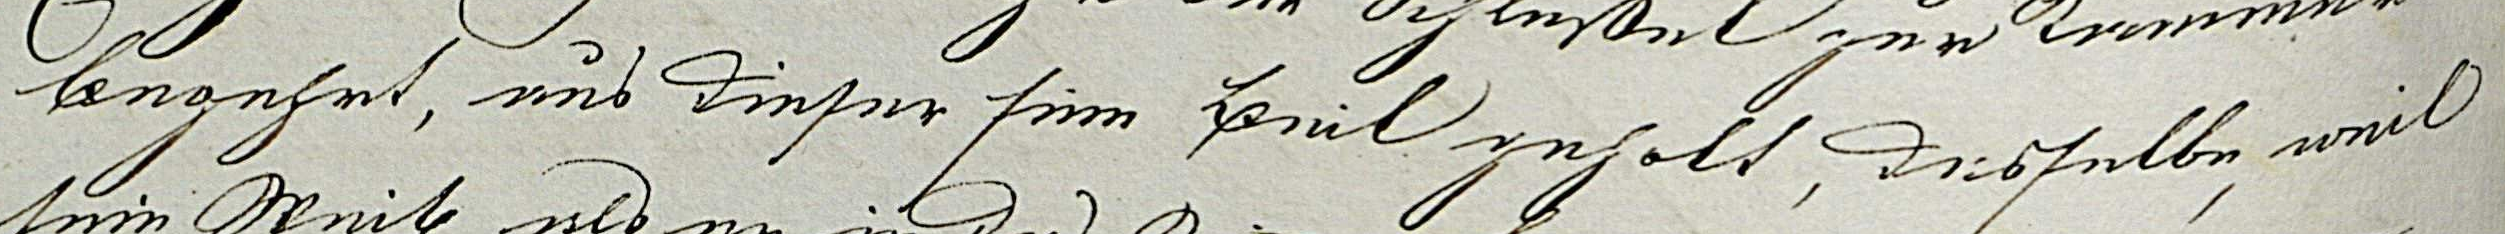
begehrt, aus dieser sein Biel geholt, desselbe weil
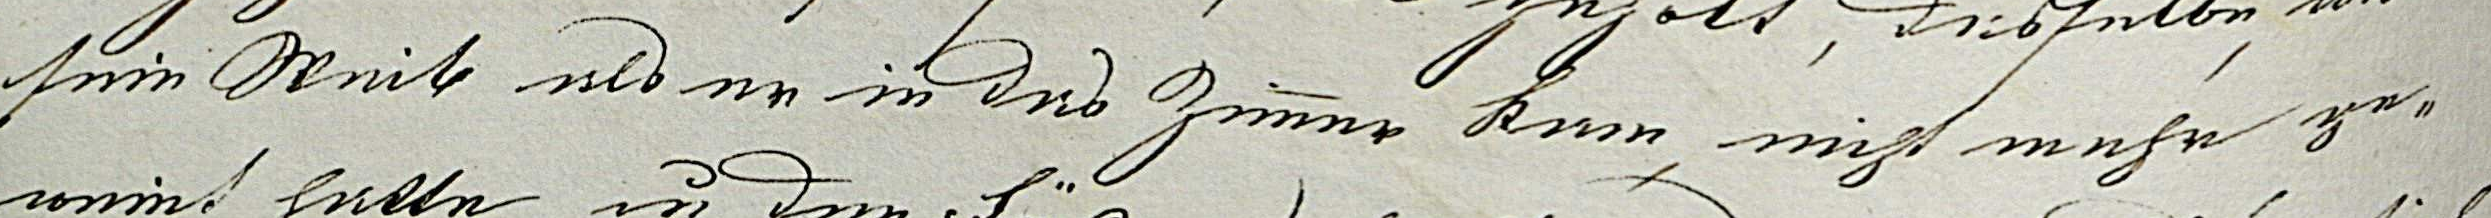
sein Weib als er in das Zimmer kam, nicht mehr ge¬
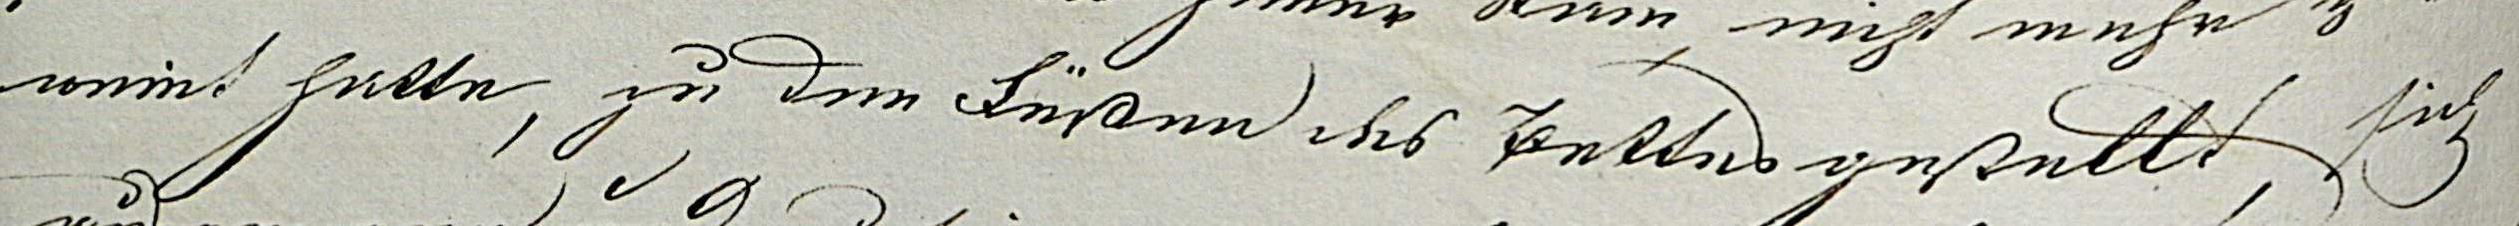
weint hatte, zu den Füßen des Bettes gestellt, sich
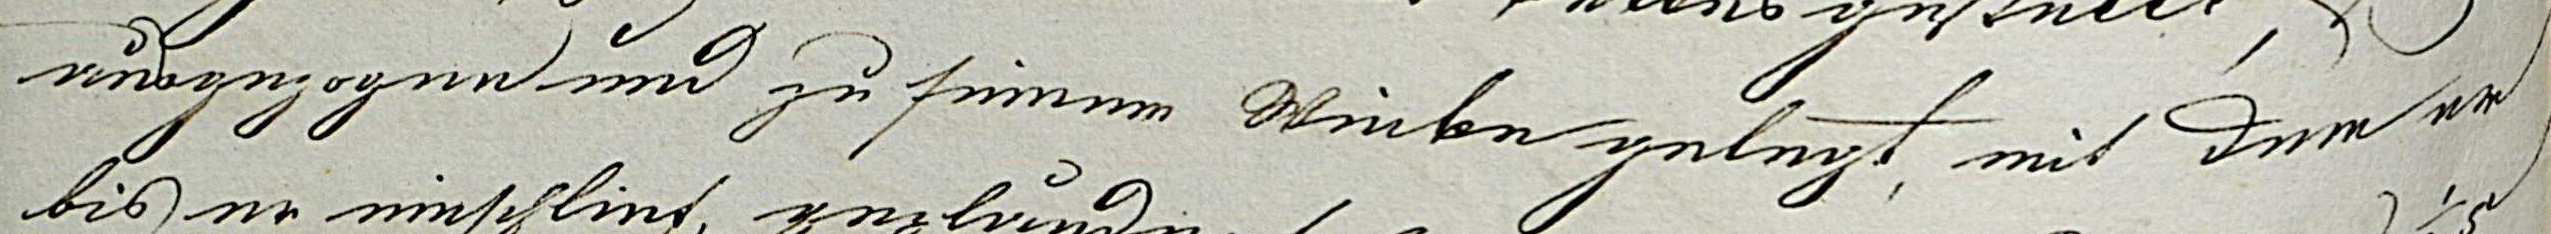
ausgezogen und zu seinem Weibe gelegt, mit dem er
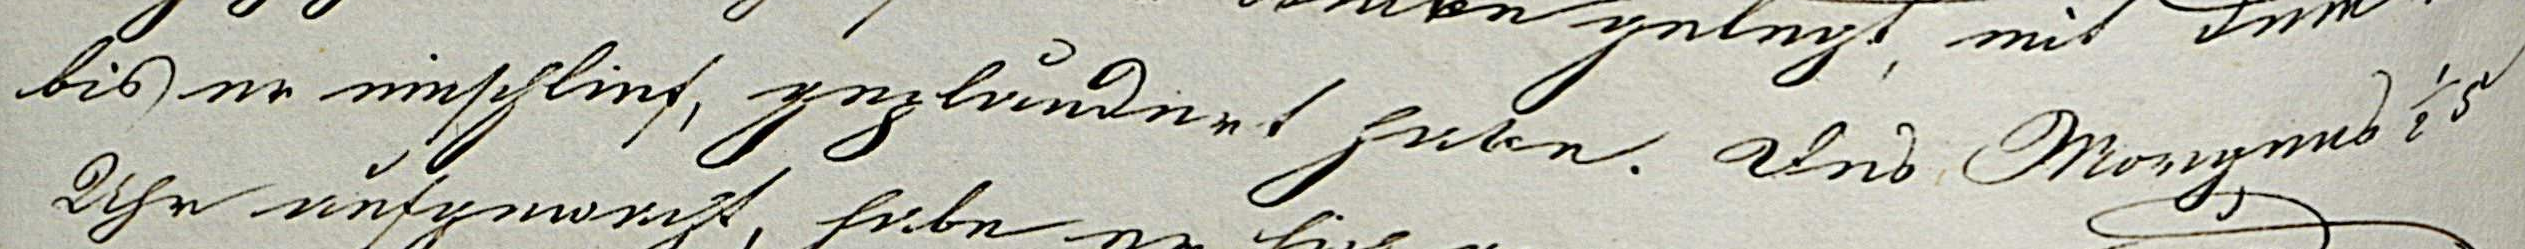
bis er einschlief, geplaudert habe. Des Morgens ½ 5
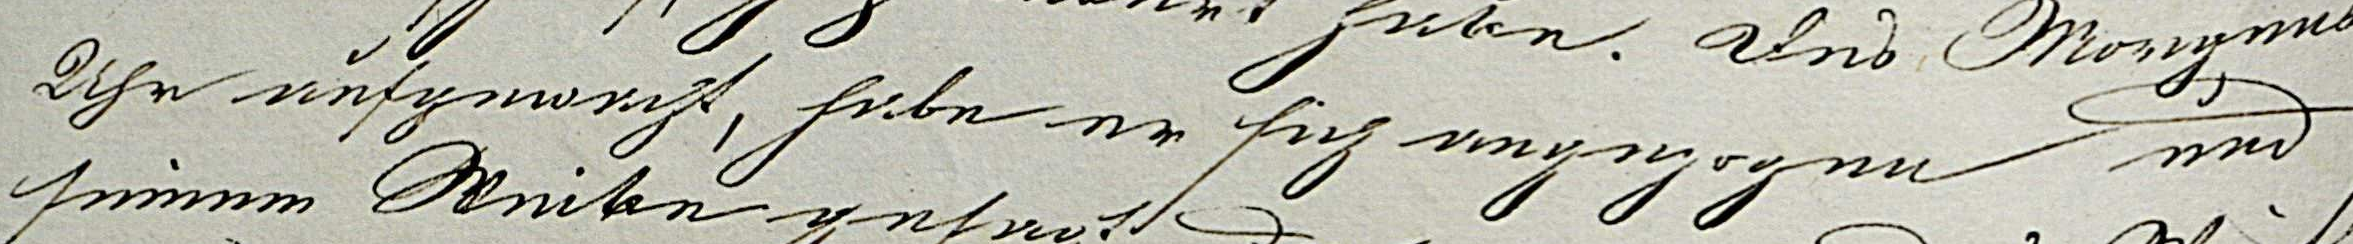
Uhr aufgewacht, habe er sich angezogen und
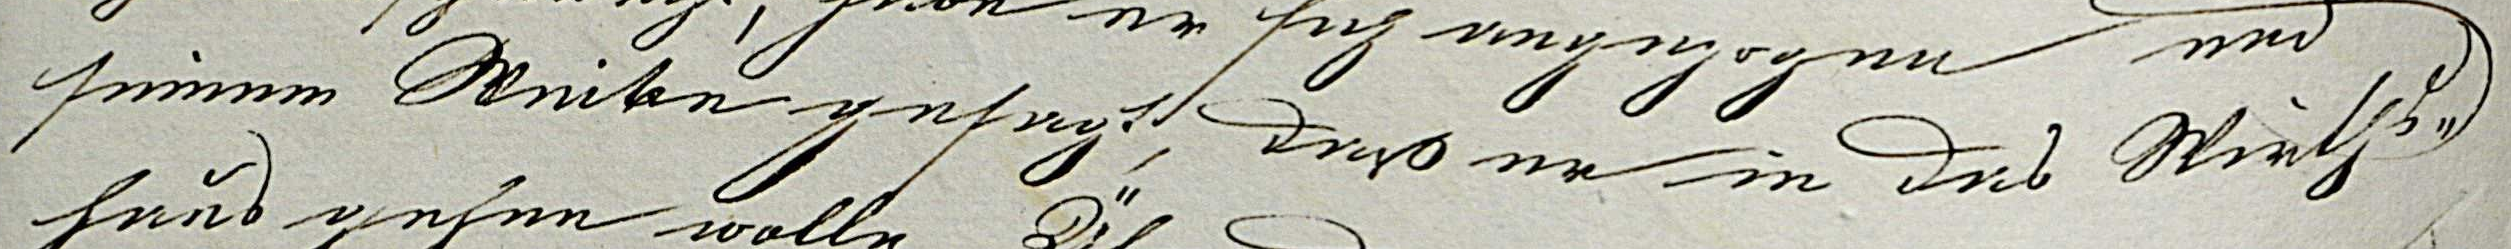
seinem Weibe gesagt, daß er in das Wirths¬
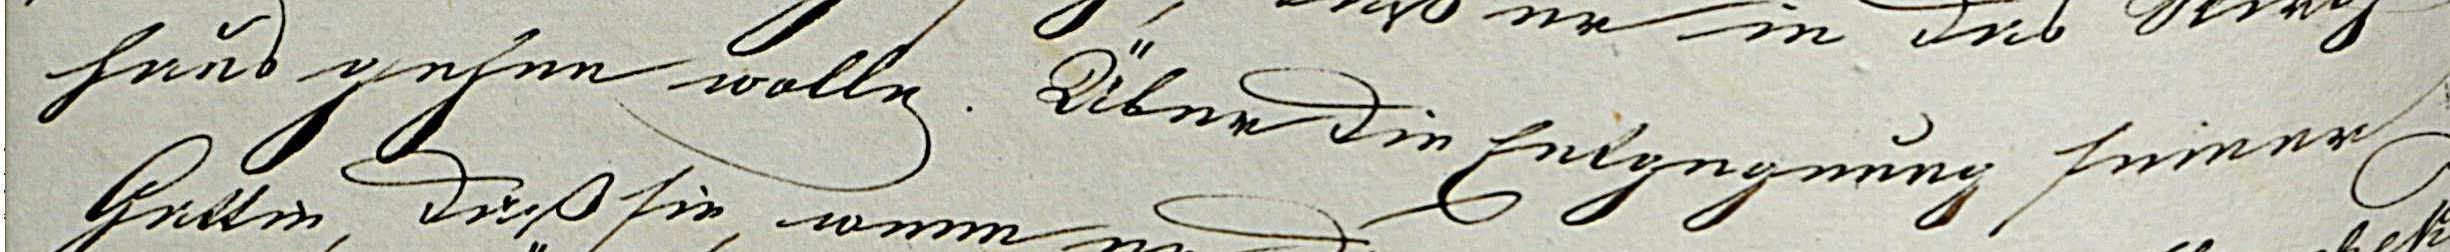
haus gehen wolle. Über die Entgegnung seiner
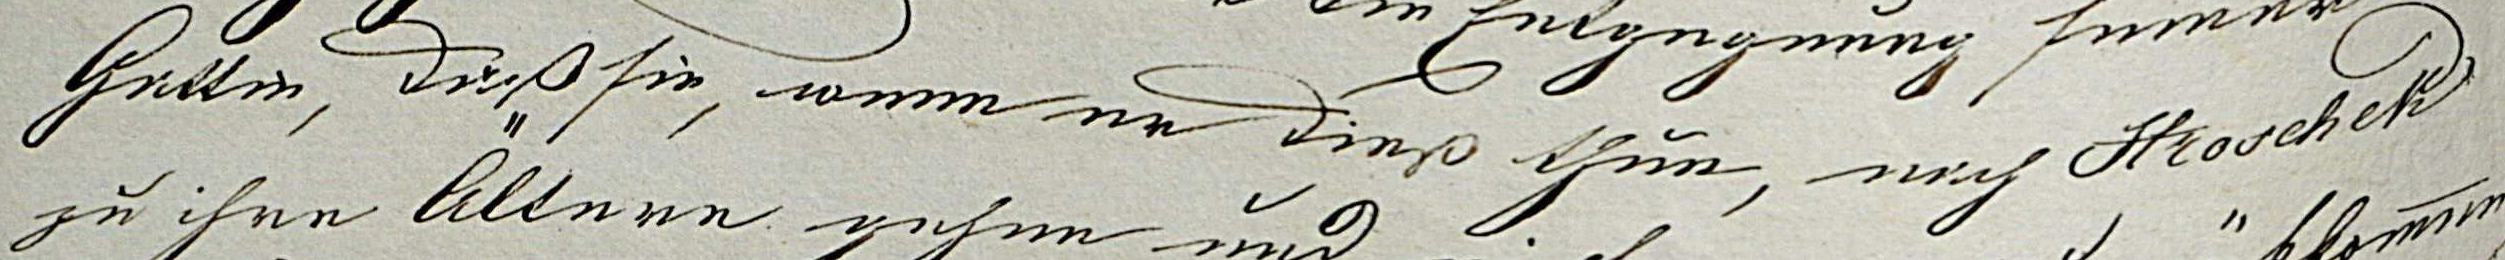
Gattin, daß sie, wenn er dies thue, nach Hroschek
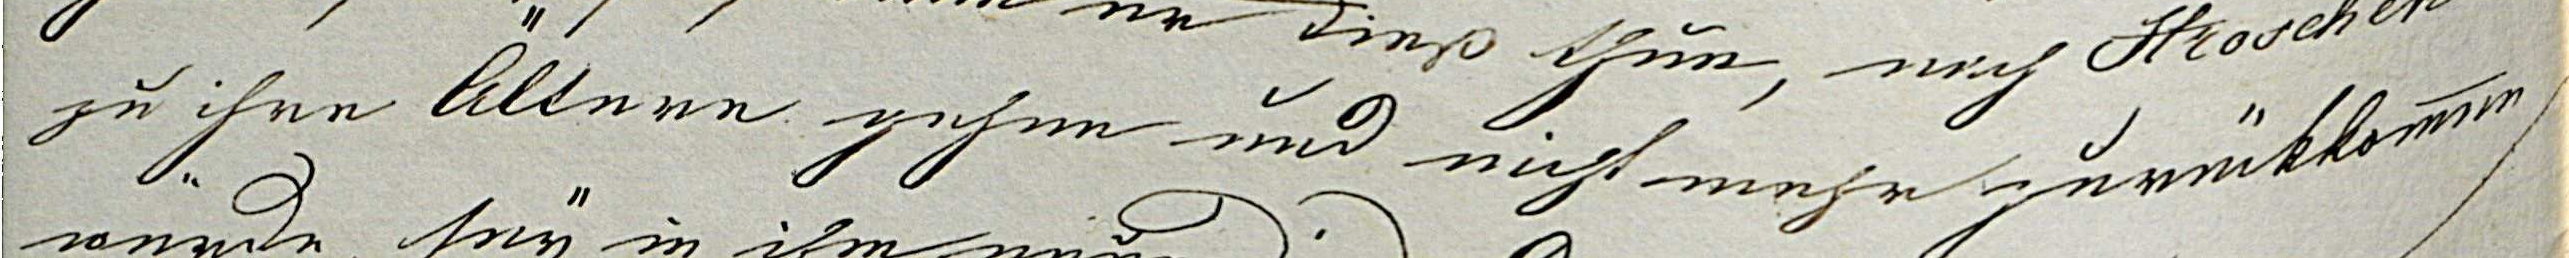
zu ihre Ältern gehen und nicht mehr zurückkommen
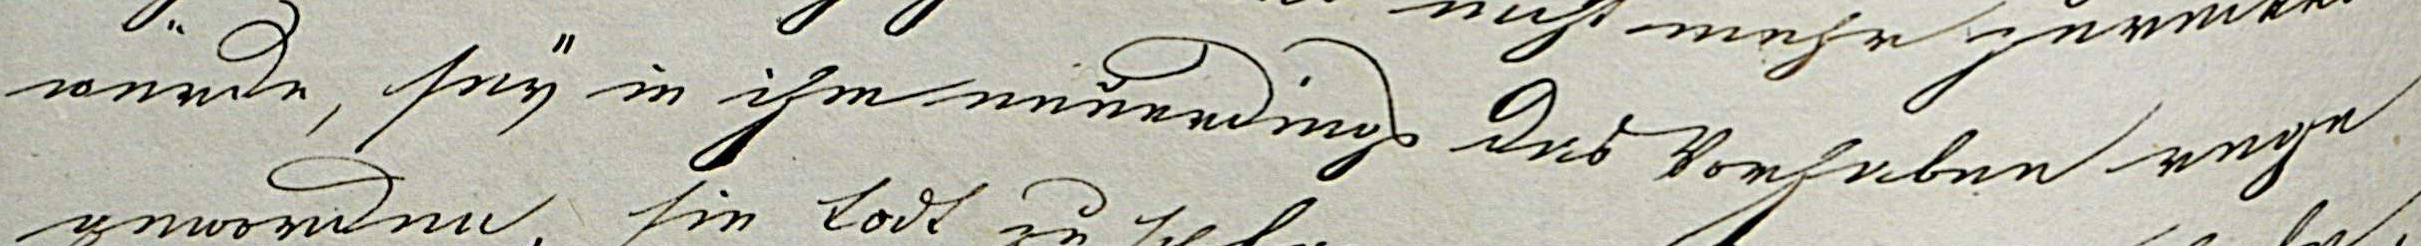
würde, sey in ihm neuerdings das Vorhaben rege
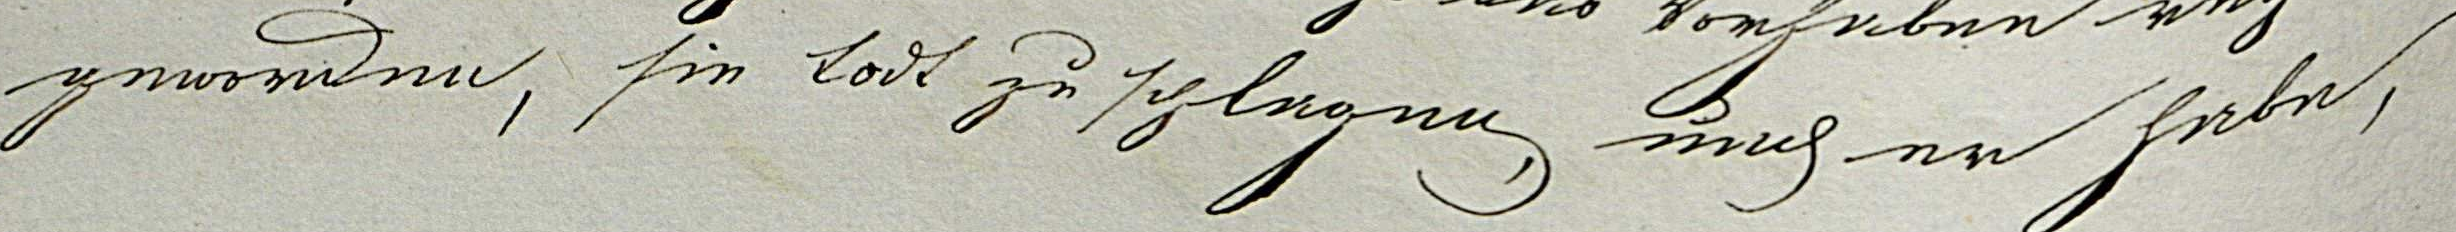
geworden, sie todt zu schlagen, auch er habe,
